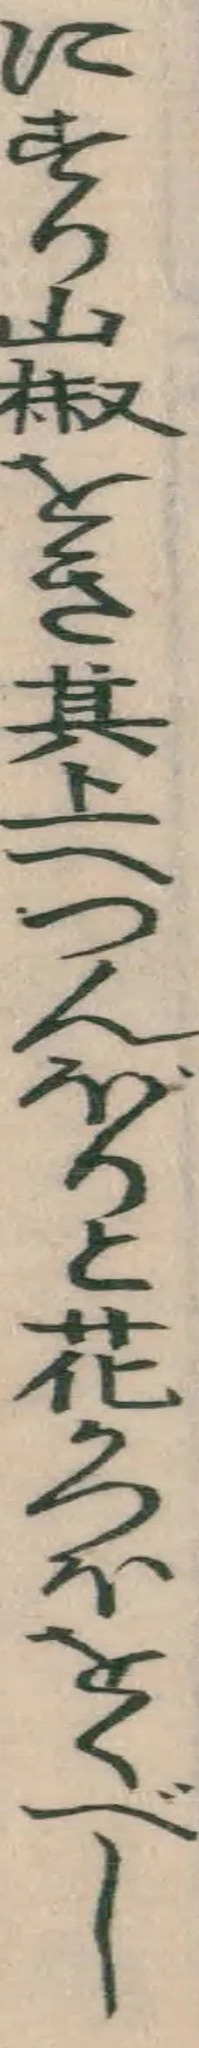にすり山椒をき其上へつんぼりと花かつほをくべし
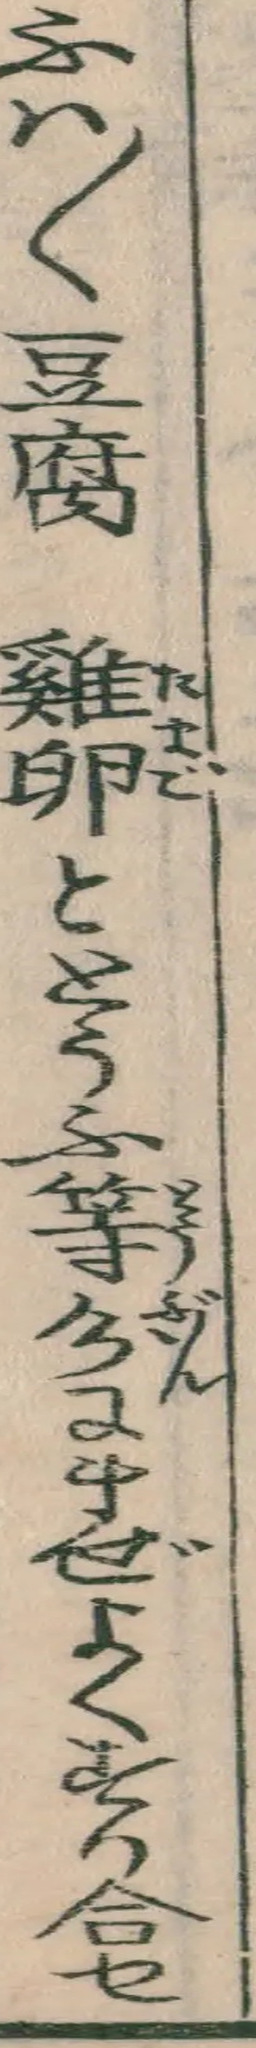[廿一]ふは〳〵豆腐雞卵ととうふ等分にまぜよくすり合せ
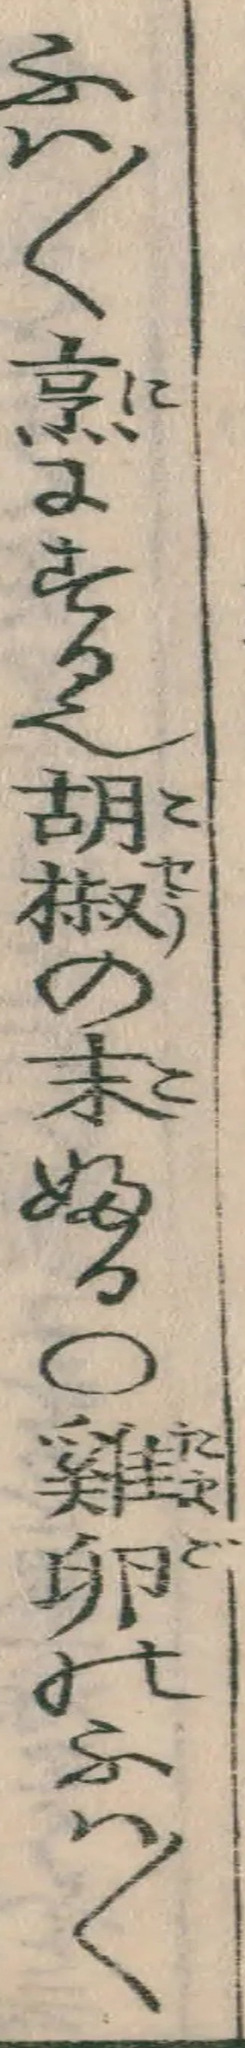ふは〳〵烹にする也胡椒の末ふる○雞卵のふは〳〵
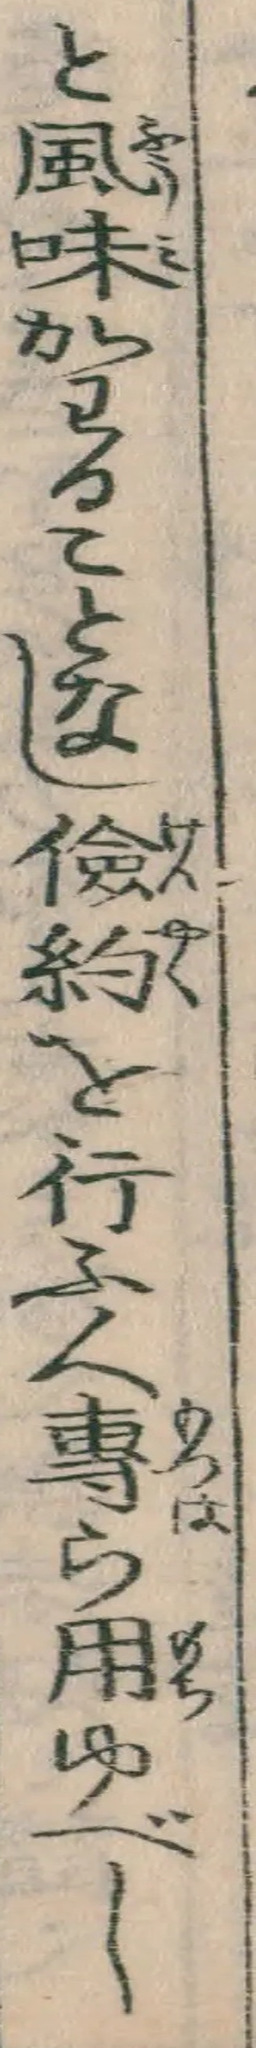と風味かわることなし儉約を行ふ人專ら用ゆべし
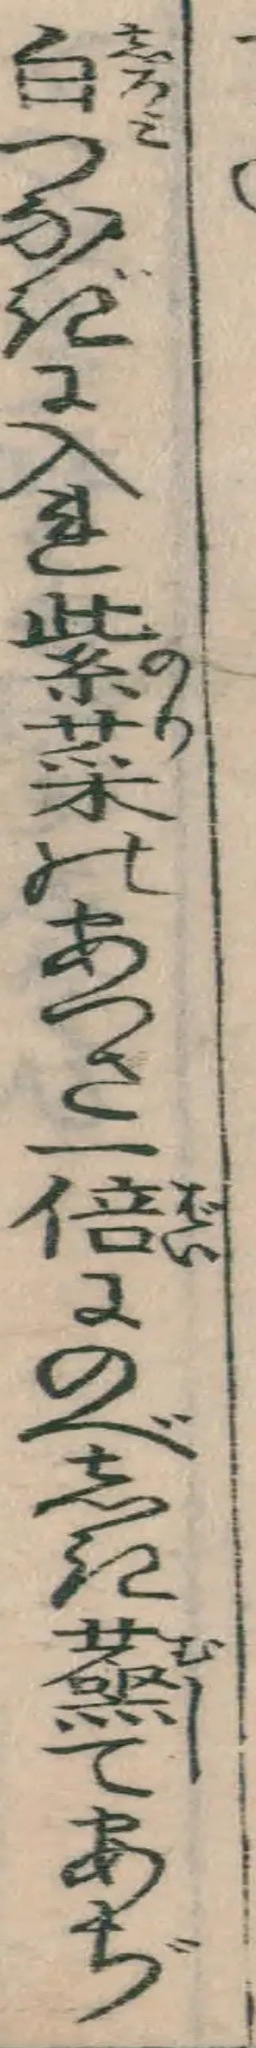白つなぎに入れ紫菜のあつさ一倍にのべしき蒸てあぢ

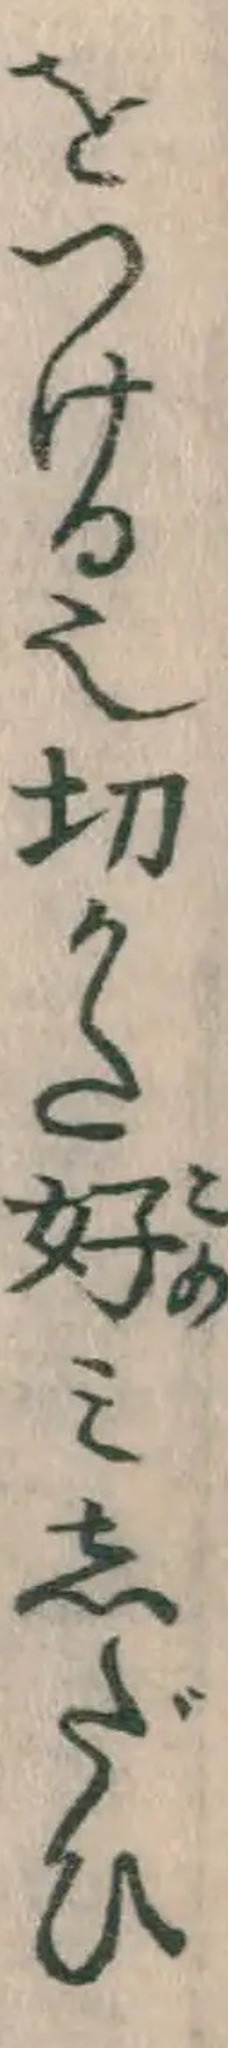をつける也切かた好みしだひ
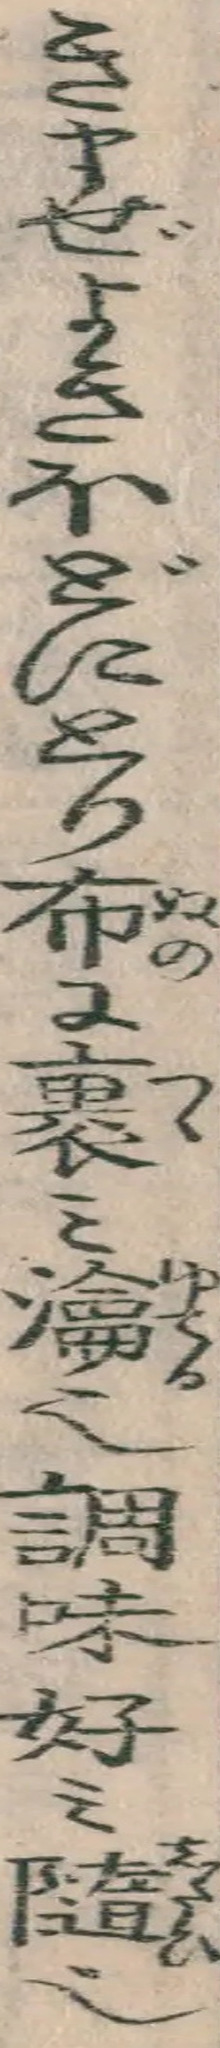きまぜよきほどにとり布に裹み瀹也調味好み隨也
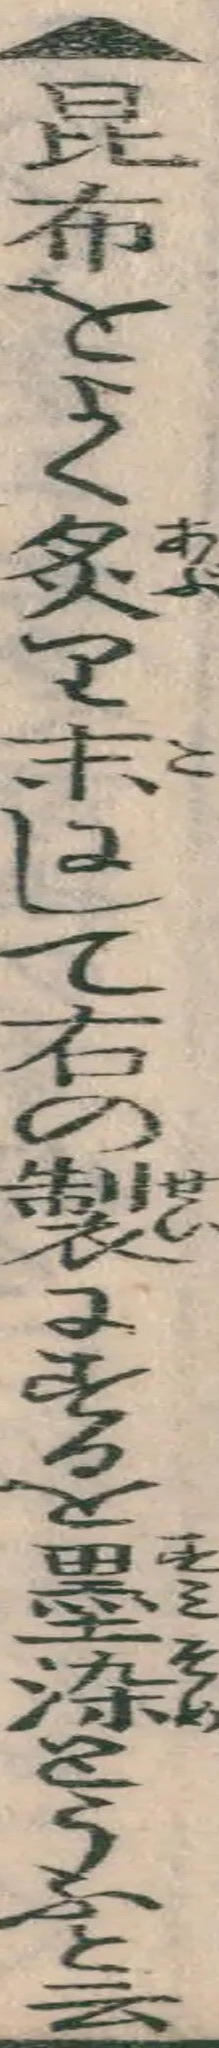▲昆布をよく炙り末にして右の製にするを墨染とうふと云
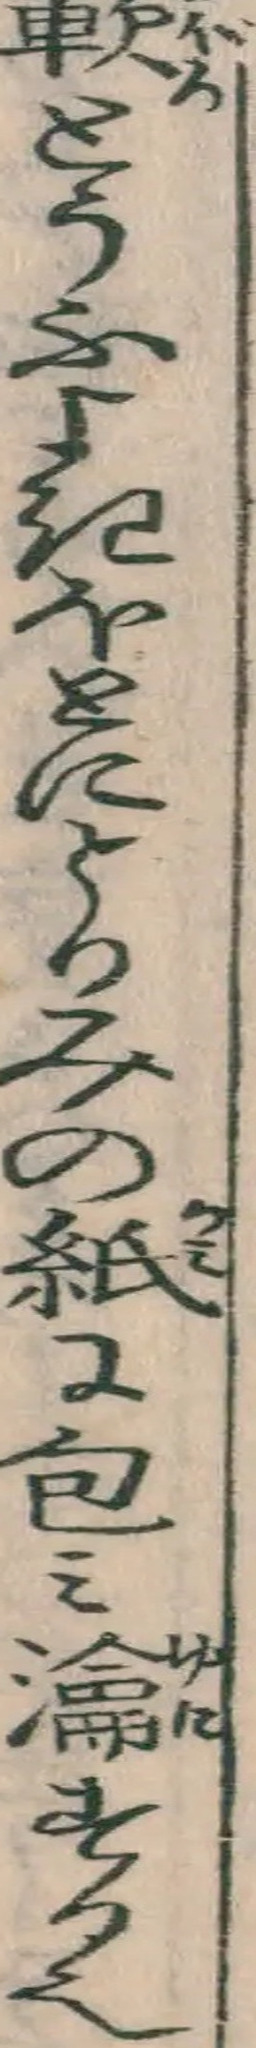[廿五]豆乳軟とうふよきほとにとりみの紙に包み瀹する也
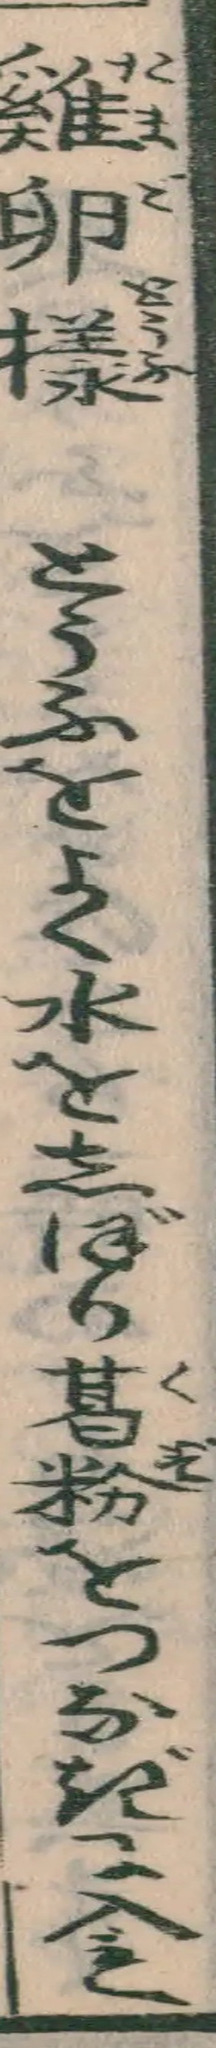[廿六]雞卵様とうふをよく水をすぼり葛粉をつなぎに入れ
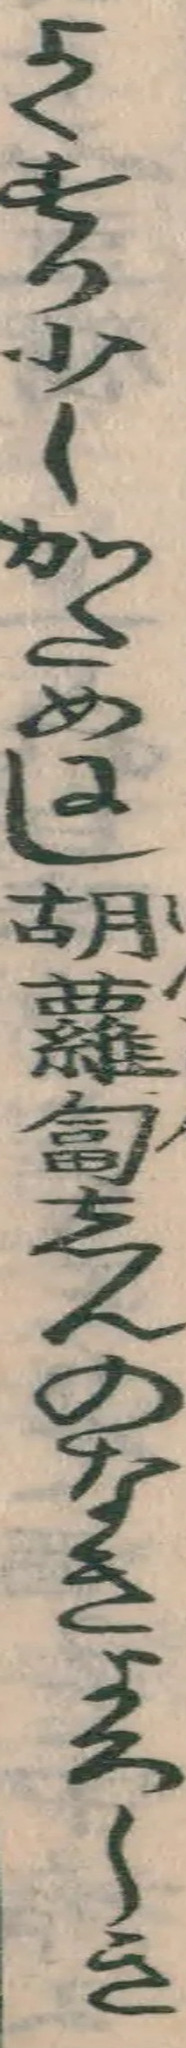よくすり少しかためにし胡蘿匐しんのなきよろしき
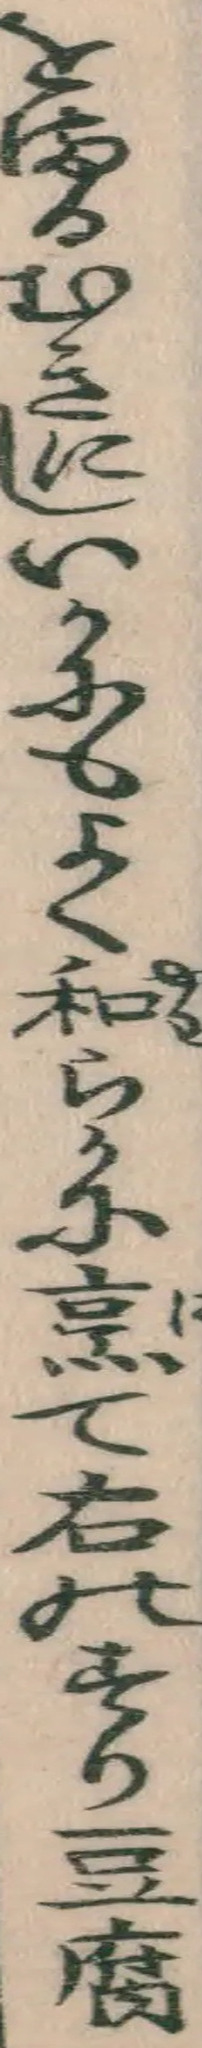をまるむきにしいかにもよく和らかに烹て右のすり豆腐
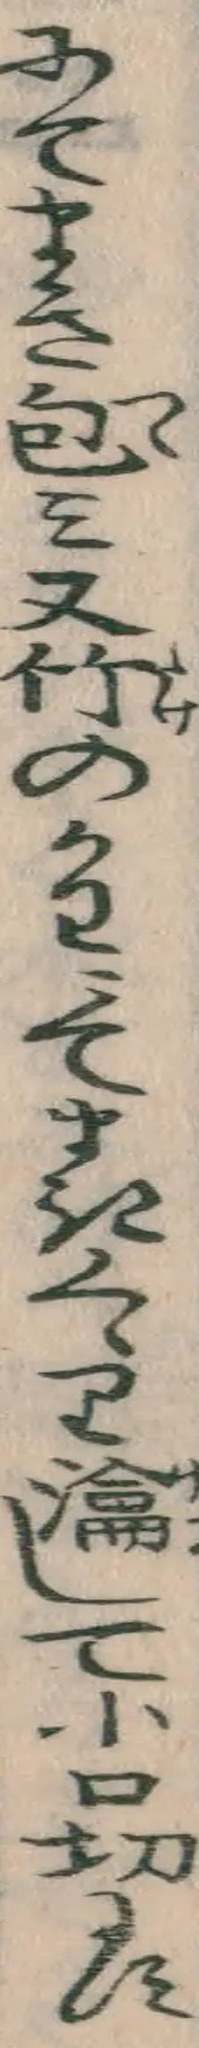にてまき包み又竹のかわにてまきくゝり瀹して小口切にす
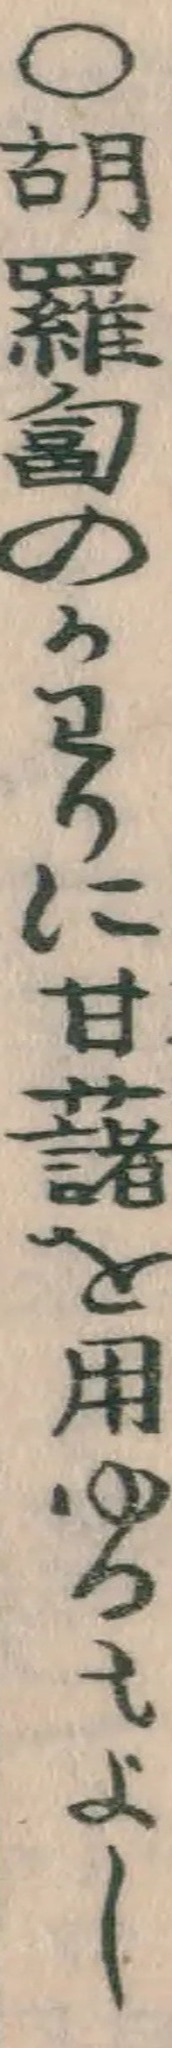○胡蘿匐のかわりに甘藷を用ゆるもよし

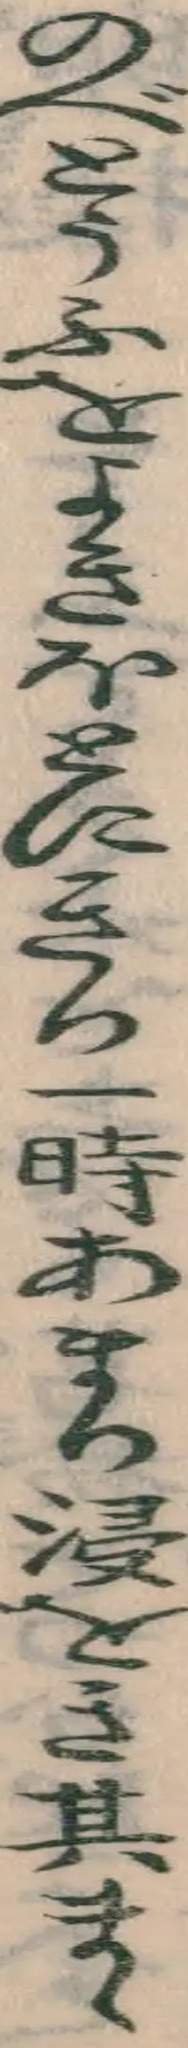のべとうふをよきほとにきり一時あまり浸をき其まゝ
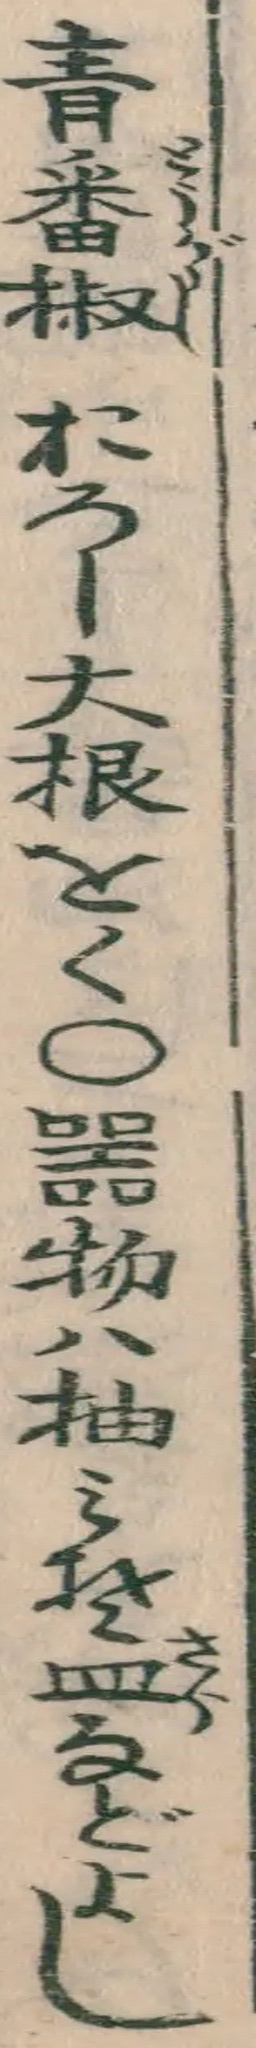青番椒おろし大根をく○器物は柚みそ皿などよし
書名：豆腐百珍. [正編]
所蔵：国立国会図書館 National Diet Library, JAPAN
